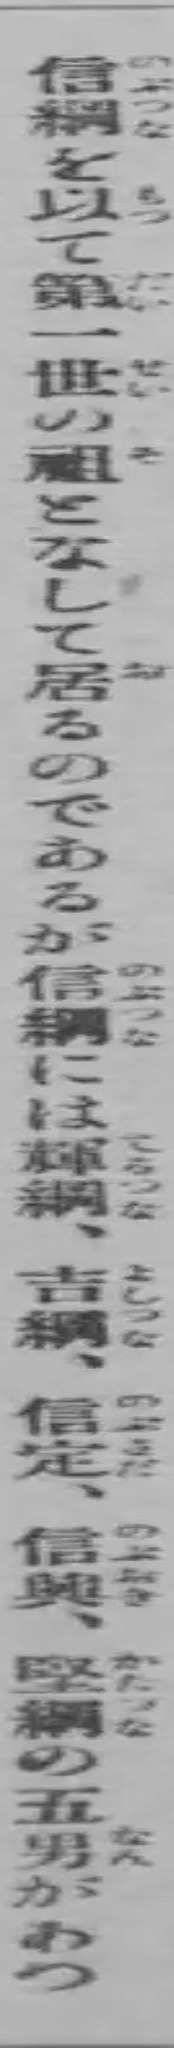信綱を以て第一世の祖となして居るのであるが信綱には輝綱、吉綱、信定、信興、堅綱の五男があつ
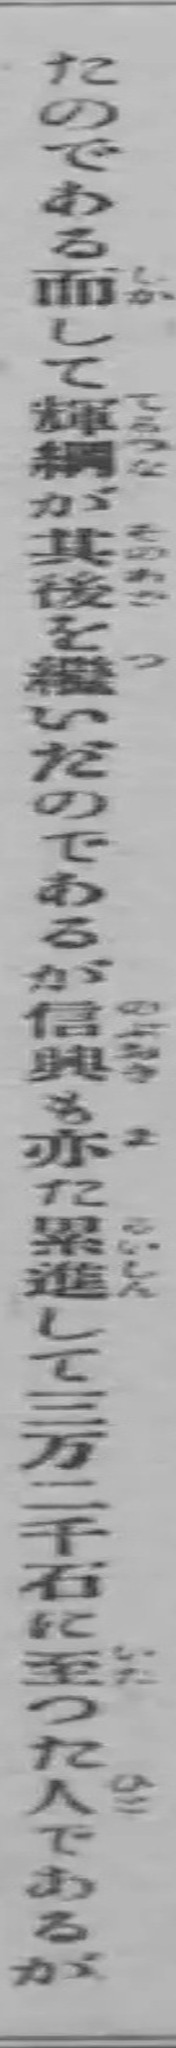たのである而して輝綱が其後を継いだのであるが信興も亦た累進して三万二千石に至つてた人であるが
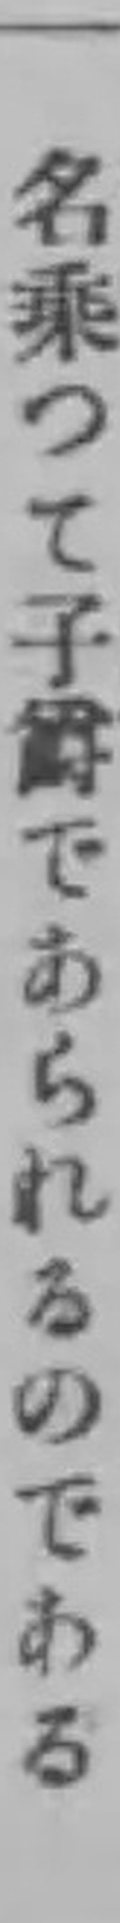名乗つて子爵であられるのである
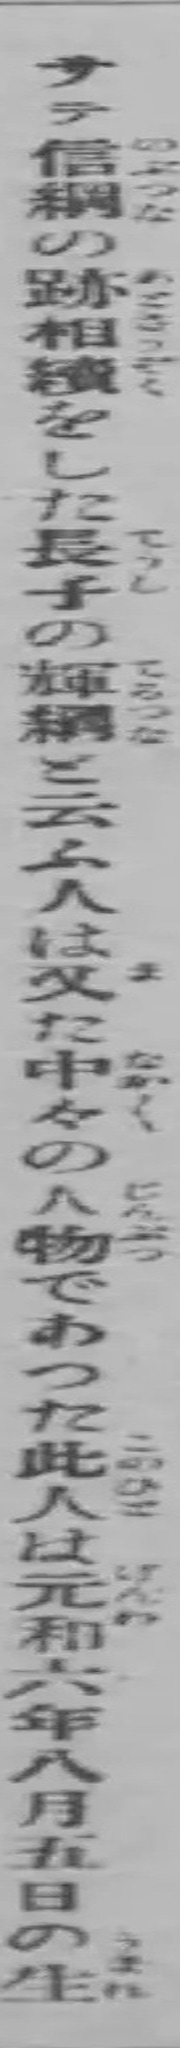大河内輝綱サテ信綱の跡相続をした長子の輝綱と云ふ人は又た中々の人物であつた此人は元和六年八月五日の生
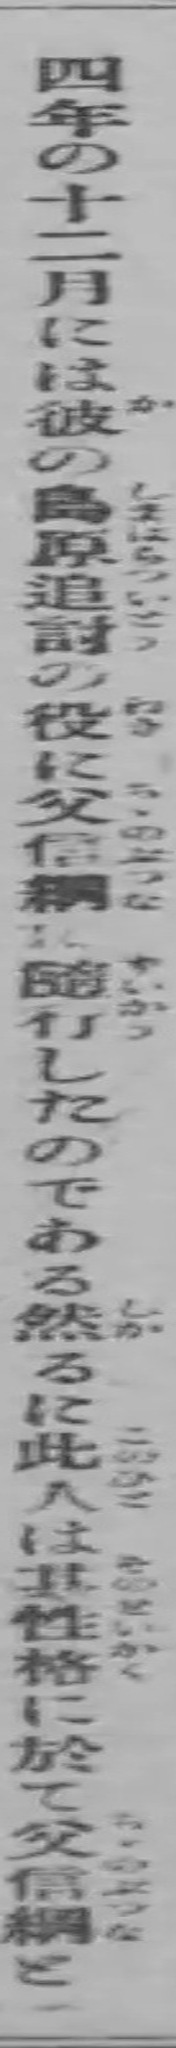四年の十二月には彼の島原追討の役に父信綱に随行したのである然るに此人は其性格に於て父信綱と
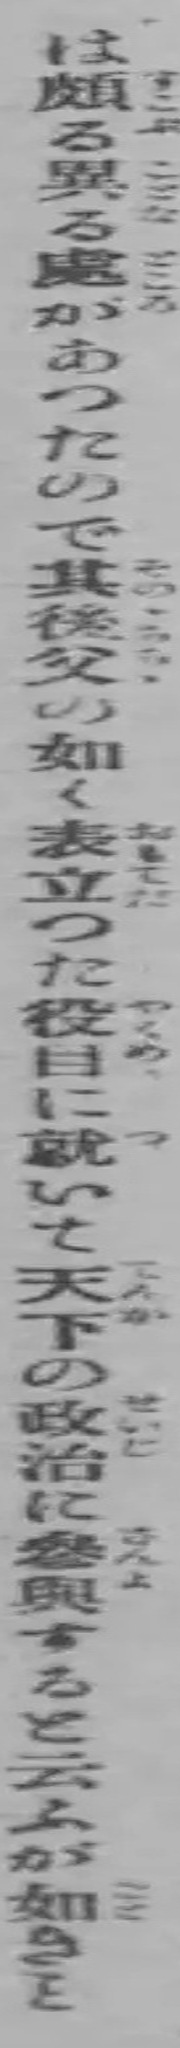は頗る異る処があつたので其後父の如く表立つた役目に就いて天下の政治に参与すると云ふが如きこと

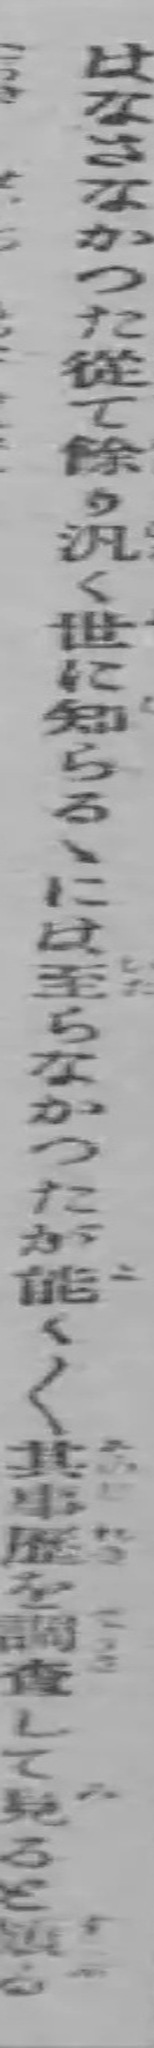はなさなかつた従て余り汎く世に知らるゝには至らなかつたが能く〳〵其事歴を調査して見ると頗る
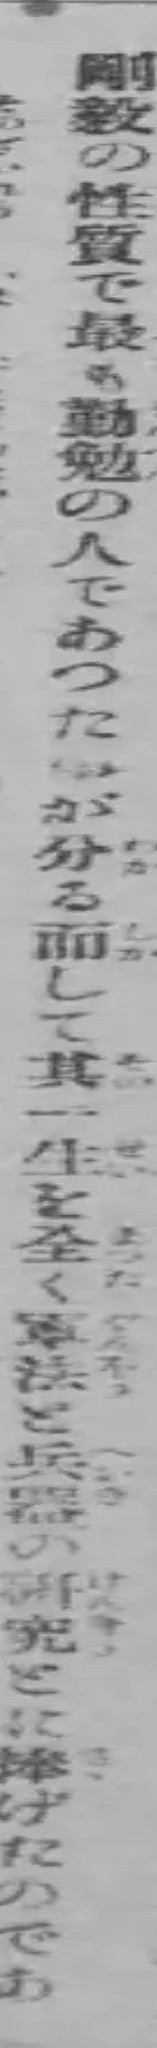剛毅の性質で最も勤勉の人であつた事が分る而して其一生を全く軍法と兵器の研究とに捧げたのであ
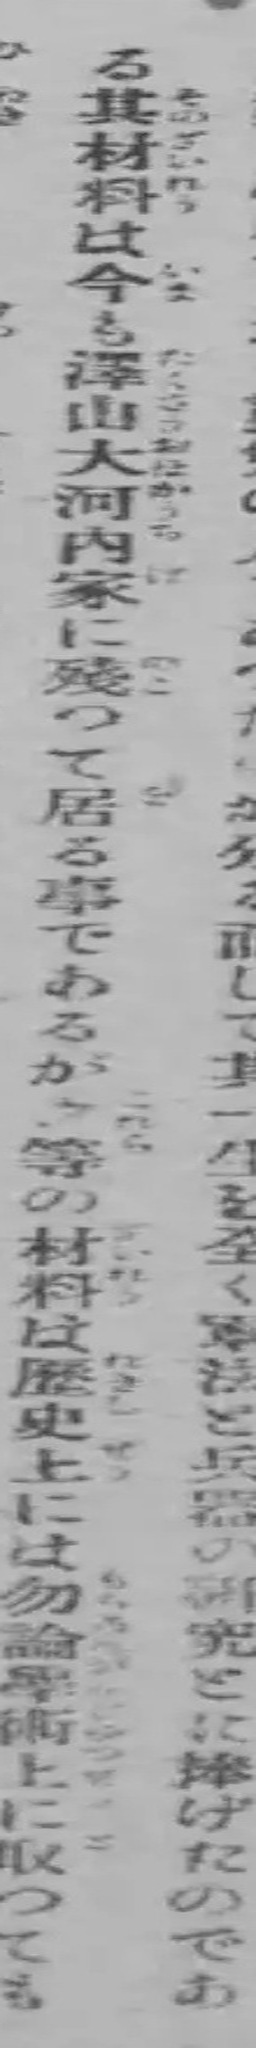る其材料は今も沢山大河内家に残つて居る事であるが之等の材料は歴史上には勿論学術上に取つても
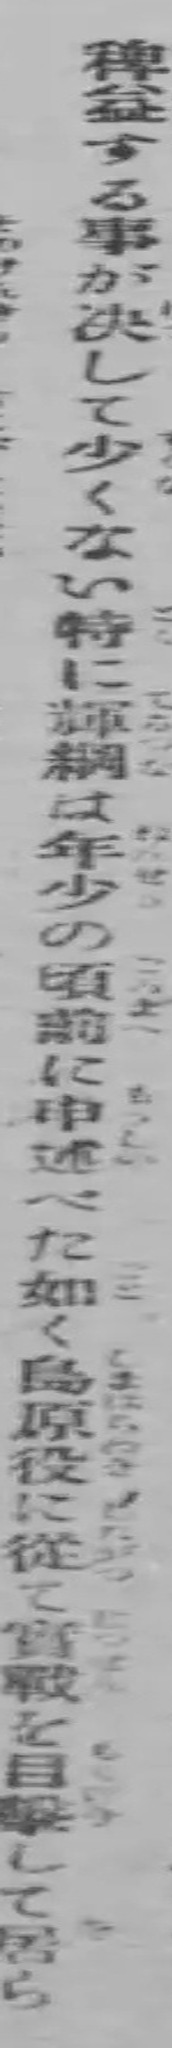稗益する事が決して少くない特に輝綱は年少の頃前にも申述べた如く島原役に従て実戦を目撃して居ら
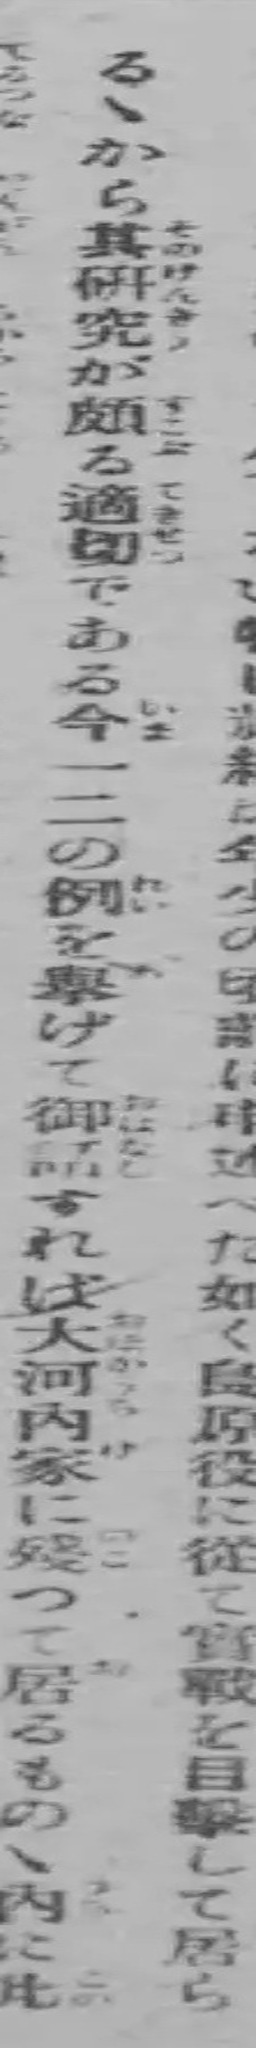るゝから其研究が頗る適切である今一二の例を挙げて御話すれば大河内家に残つて居るものゝ内に此
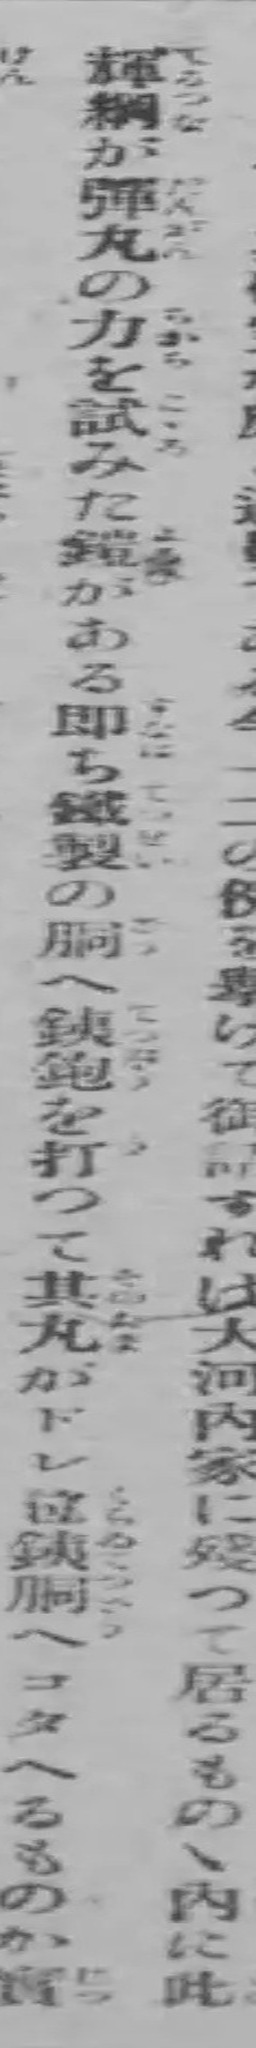輝綱が弾丸の力を試みた鎧がある即ち鉄製の胴へ鉄砲を打つて其丸がドレ位鉄胴へコタへるものか実
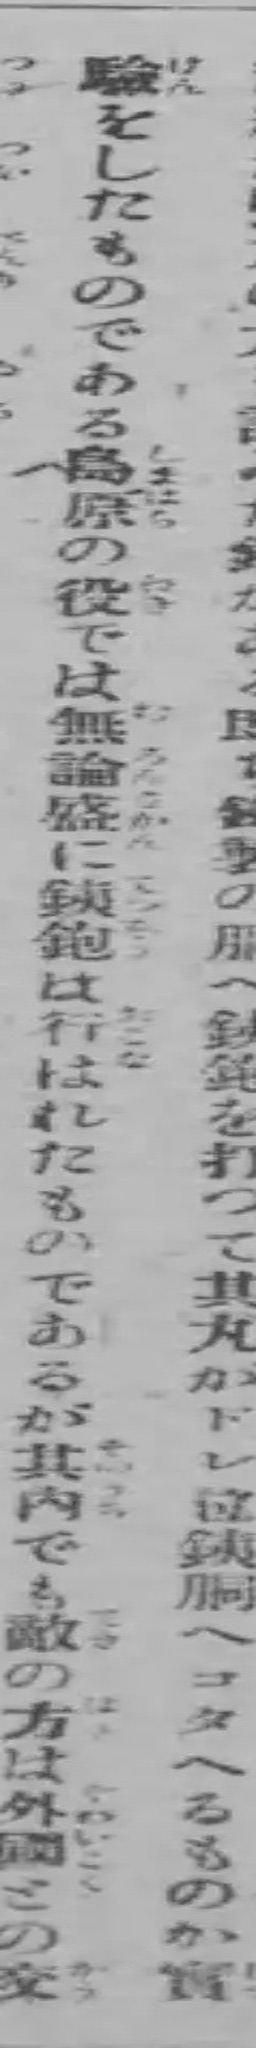験をしたものである島原の役では無論盛に鉄砲は行はれたものであるが其内でも敵の方は外国との交
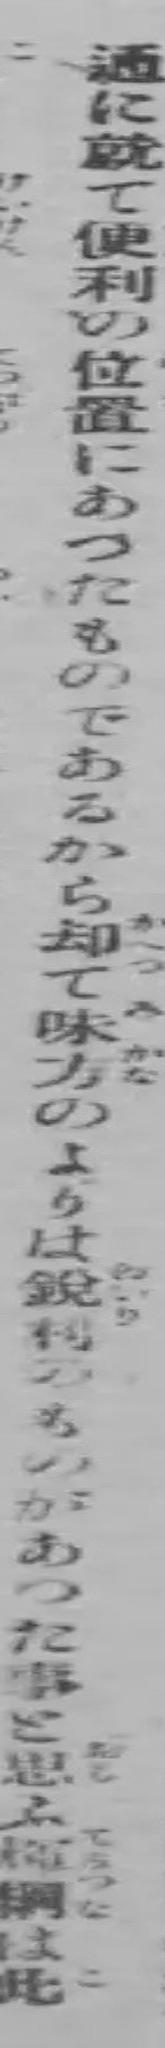通に就て便利の位置にあつたものであるから却て味方のよりは鋭利のものがあつた事と思ふ輝綱は此
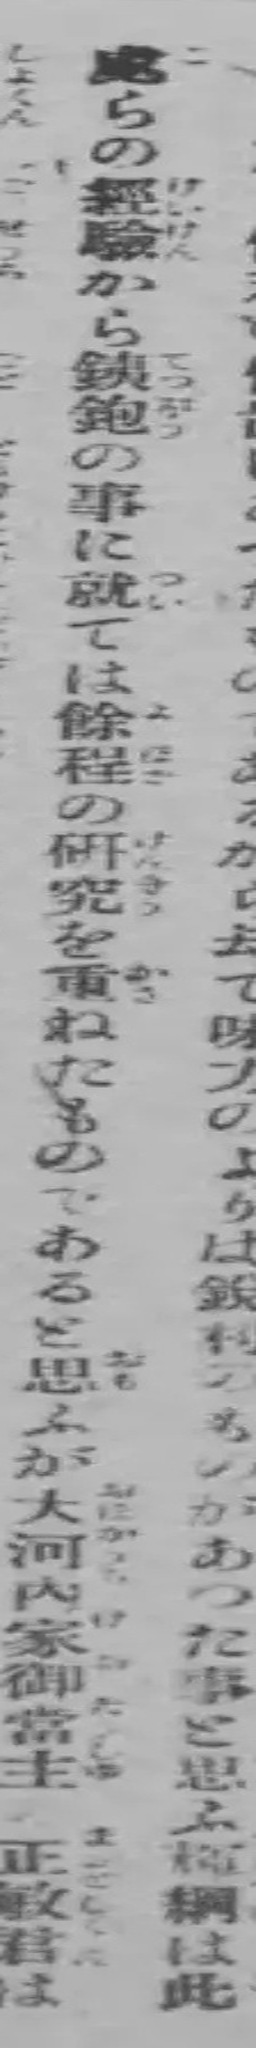処らの経験から鉄砲の事に就ては余程の研究を重ねたものであると思ふが大河内家御当主の正敏君は
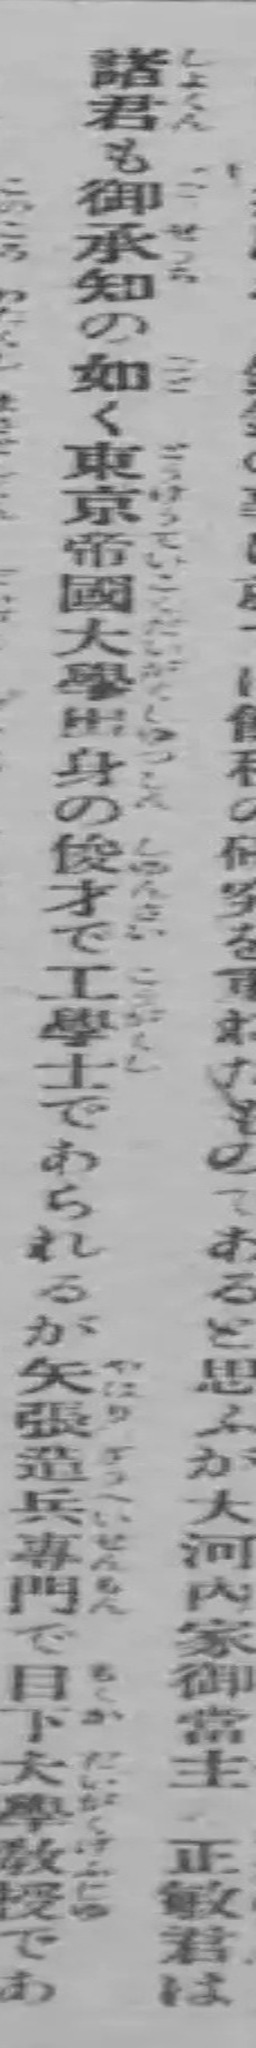諸君も御承知の如く東京帝国大学出身の俊才で工学士であられるが矢張造兵専門で目下大学教授であ
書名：豊橋市史談
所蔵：国立国会図書館 National Diet Library, JAPAN
